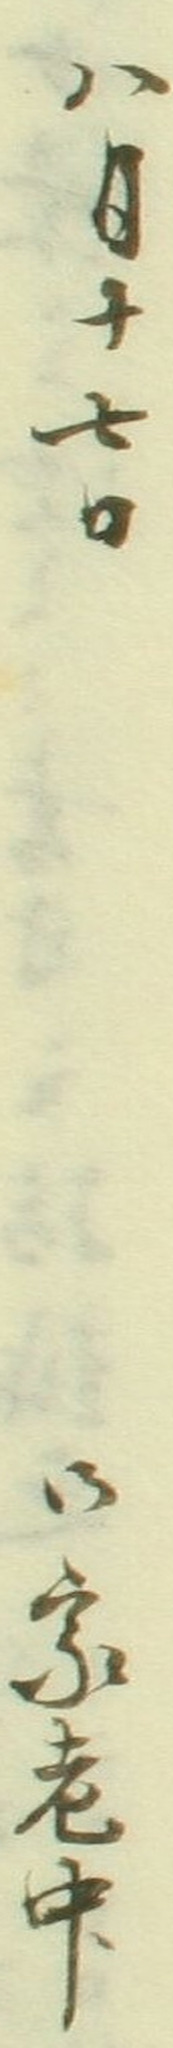八月十七日御家老中
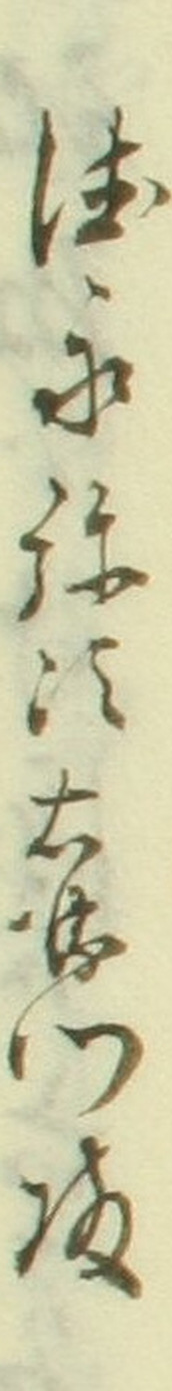徳永弥次右衛門殿

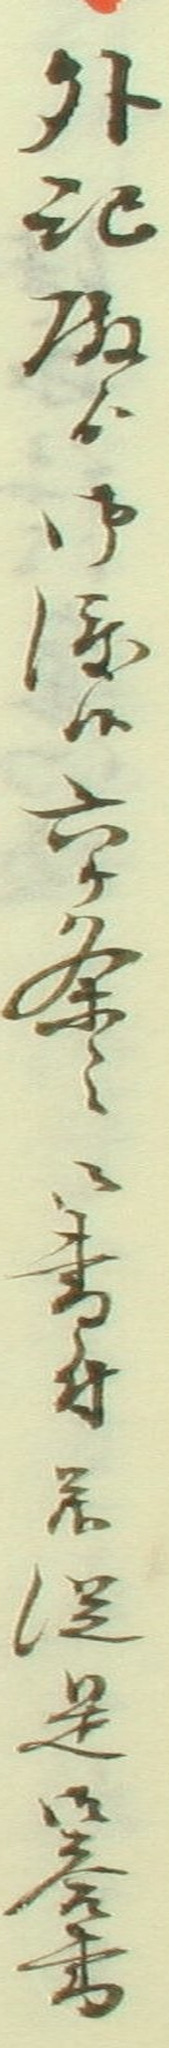外記殿ゟ御渡候六ヶ条之御書付茂従是御答書
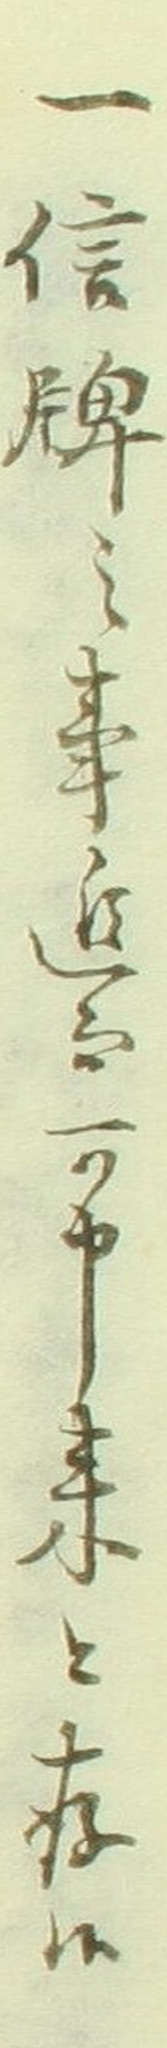一信牌之事追而可申来と存候
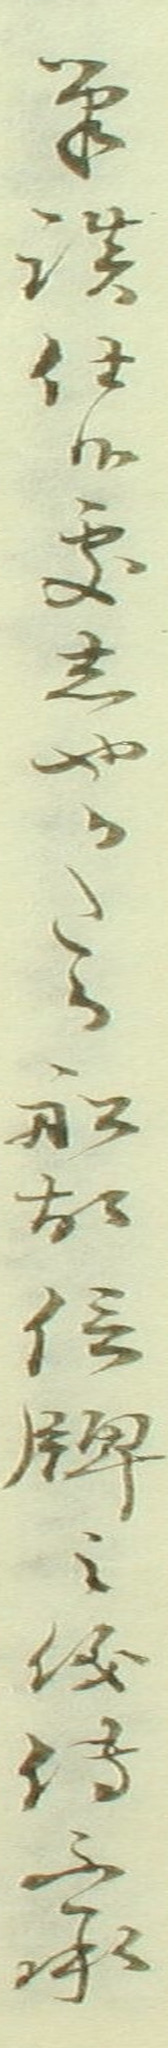筆談仕候処しやかたら船故信牌之儀伝不承
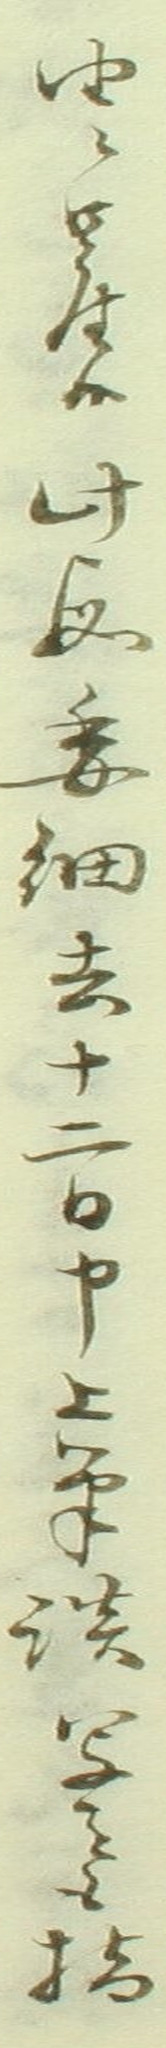由に御座候此段委細去十二日申上筆談写をも指
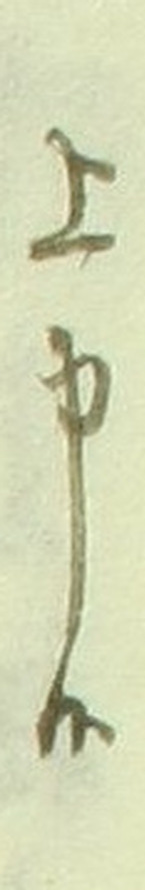上申候
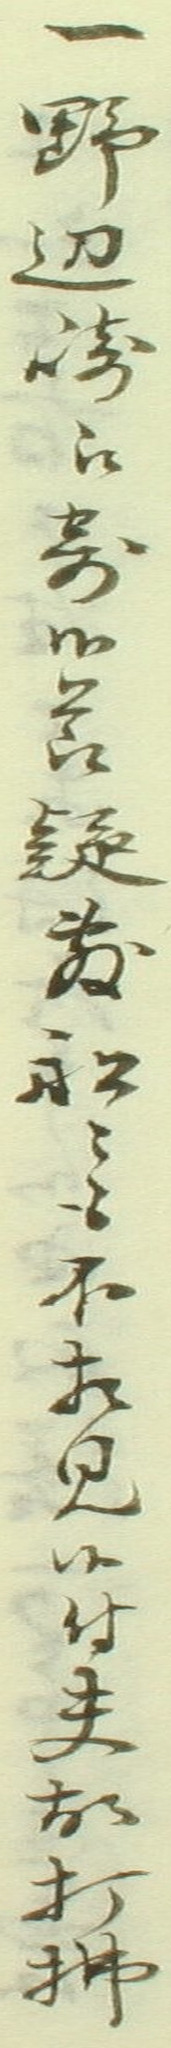一野辺崎え寄候節疑敷船々も不相見候付夫故打払
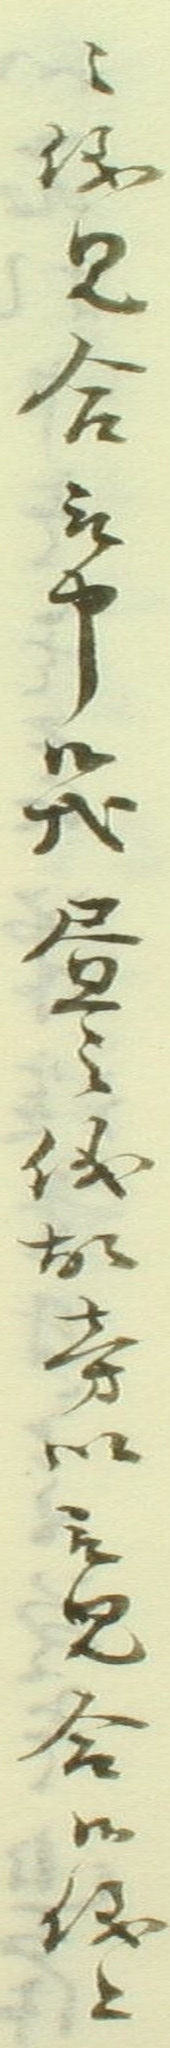之儀見合被申候哉昼之儀故旁以被見合候儀と
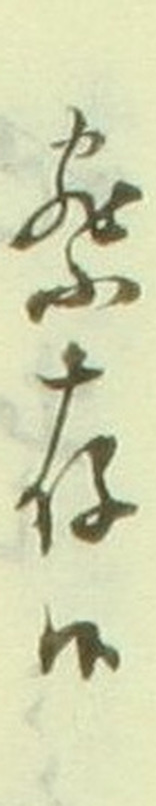察存候
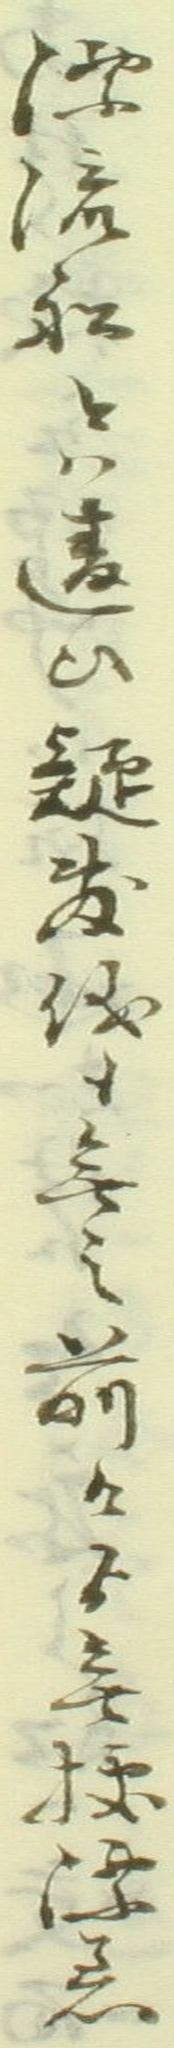漂流船とは違ひ疑敷儀も無之前々ゟ無拠漂着
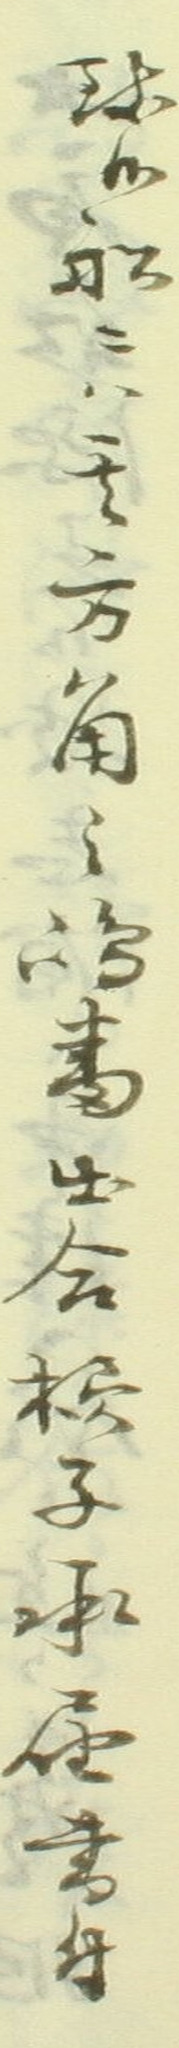致候船には其方角之島番出合様子承届書付
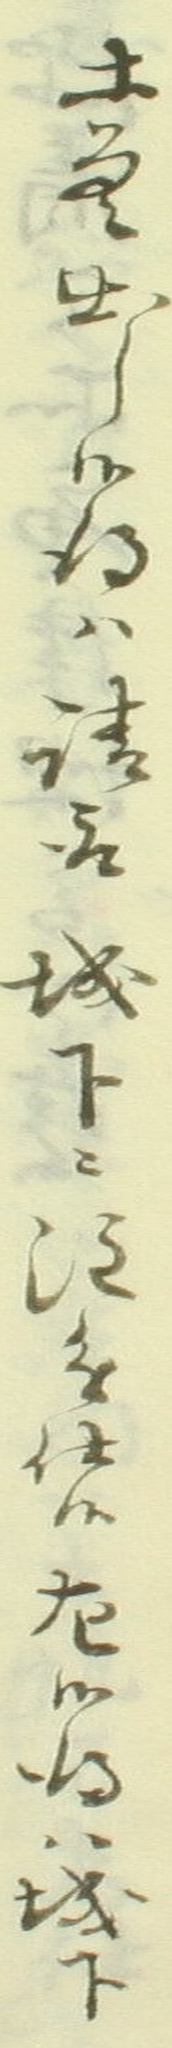等差出し候得は請取城下に注進仕候左候得は城下
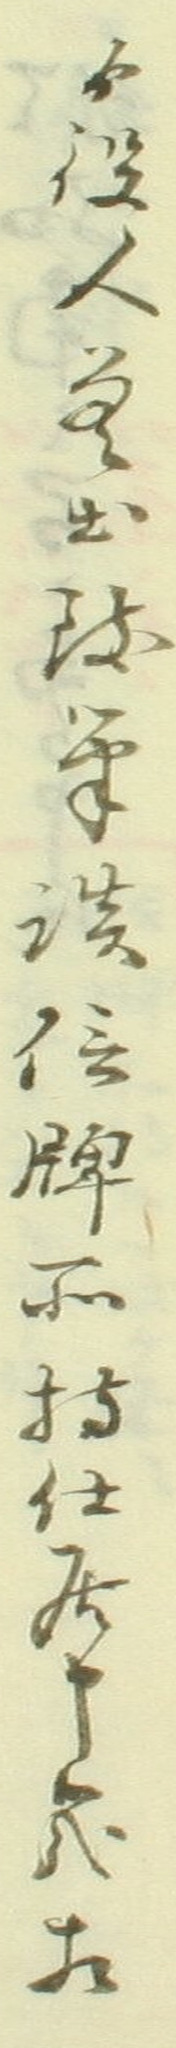ゟ役人差出致筆談信牌所持仕居申候哉相
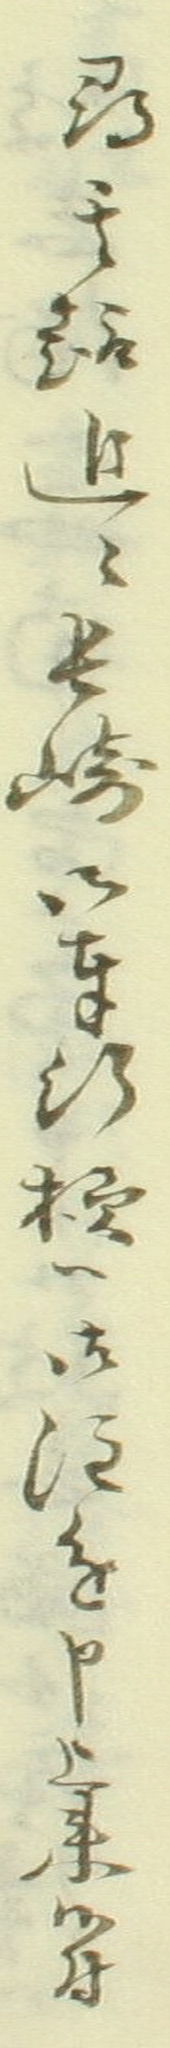尋其趣追々長崎御奉行様へ御注進申上来候付
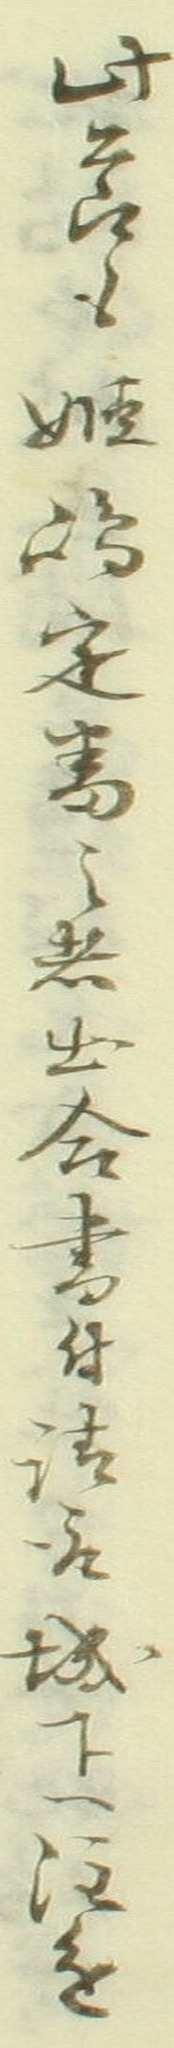其節も姫島定番之者出合書付請取城下へ注進
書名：異国船漂着記
